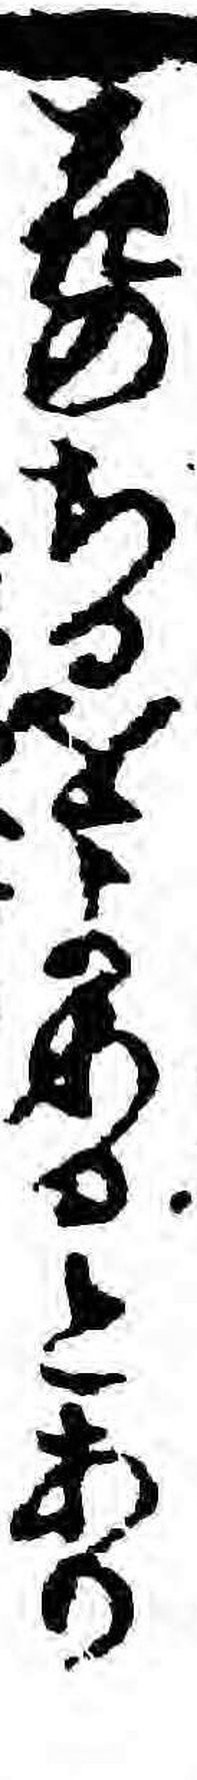花のちるをよめるとあり
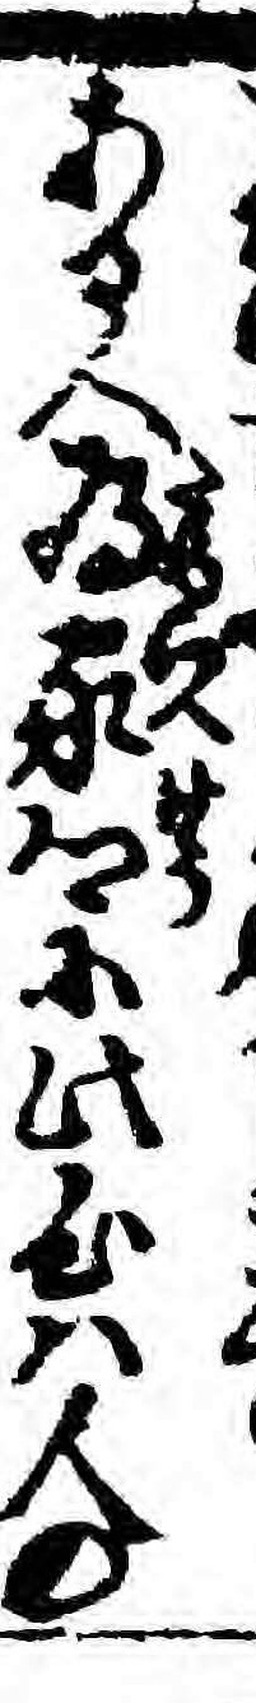ある人為家卿に此心は人の
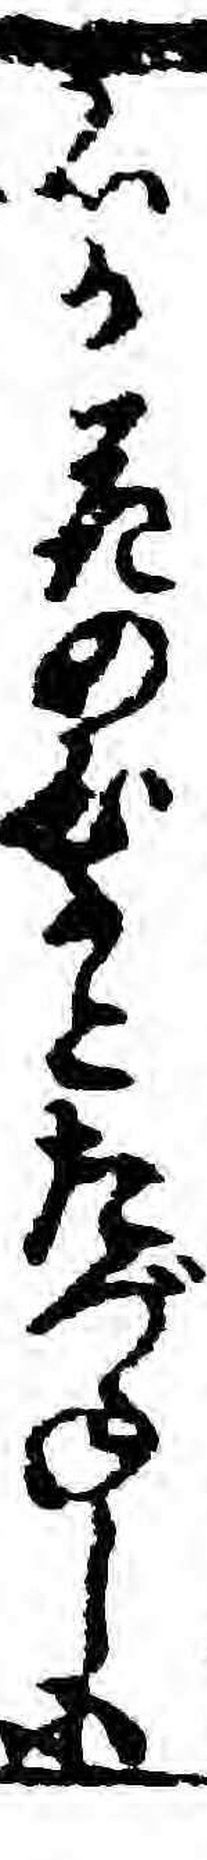心か花の心かとたづねしに
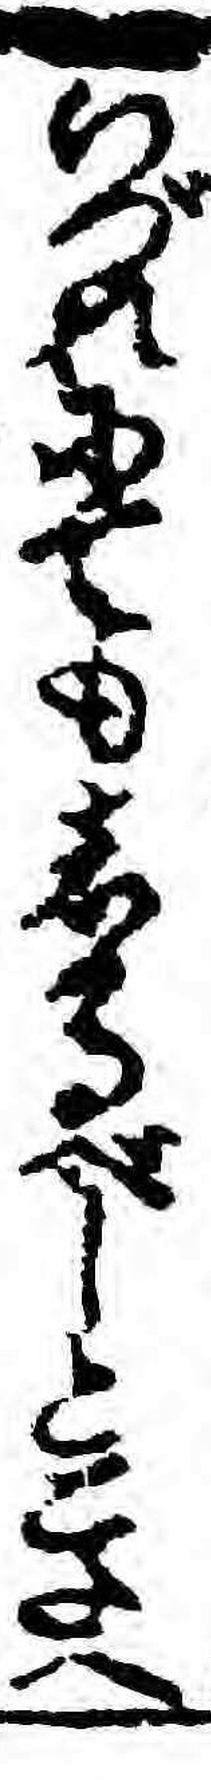いづれにてもしるべしとこたへ
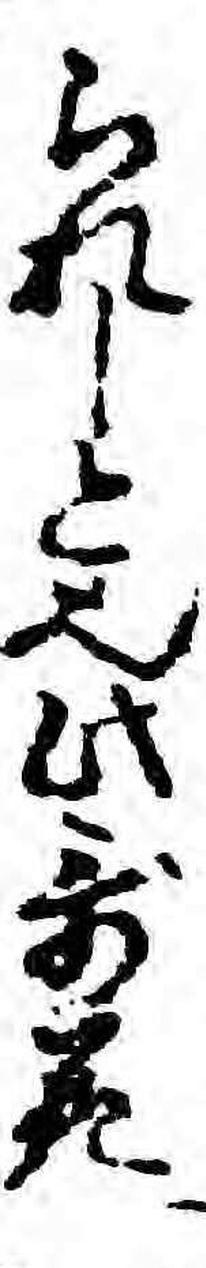られしと也此哥花
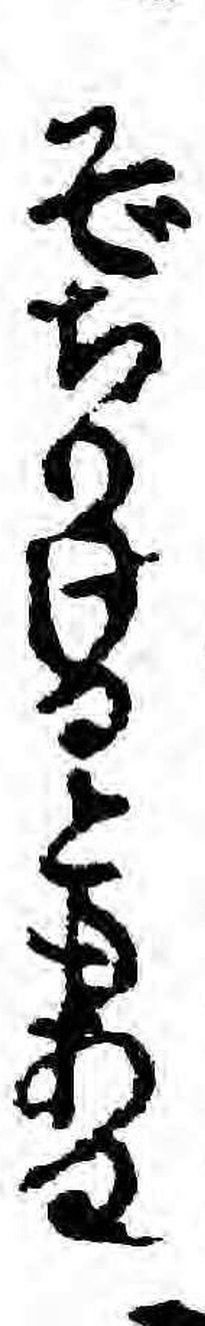ぞちりけるともある
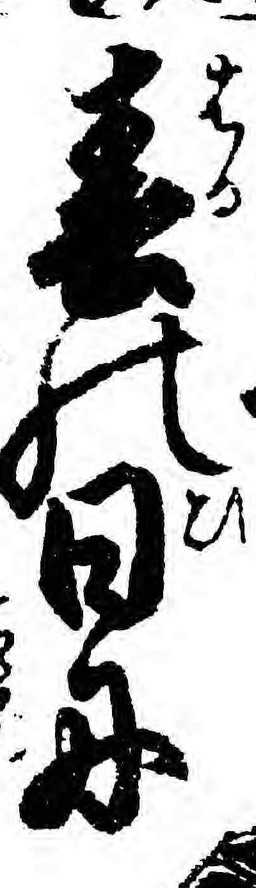春の日に
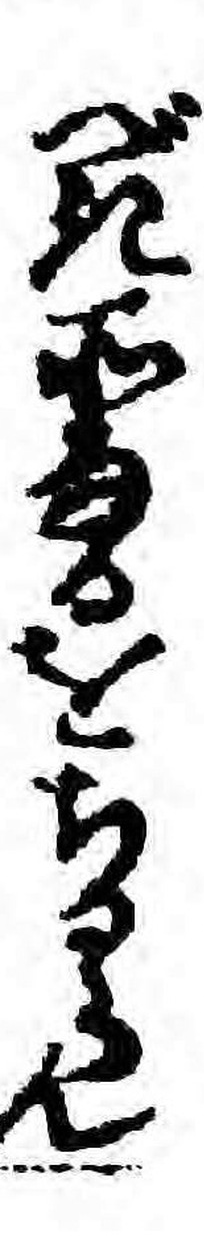べき所なるをちるらん
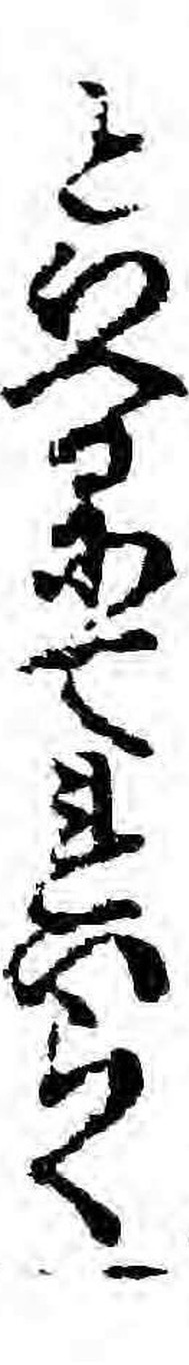といへるにてれいらく
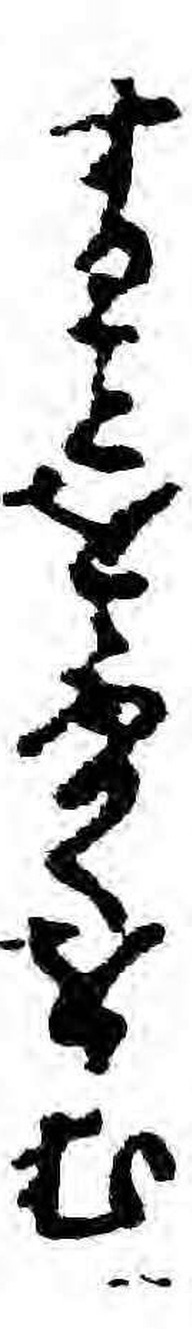することをふかくをしむ
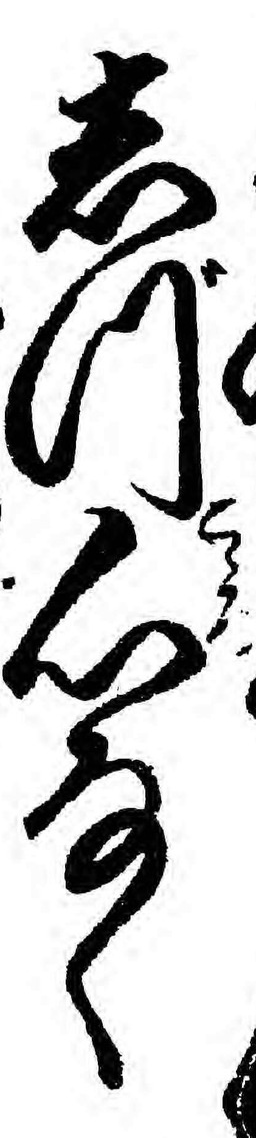しづ心なく
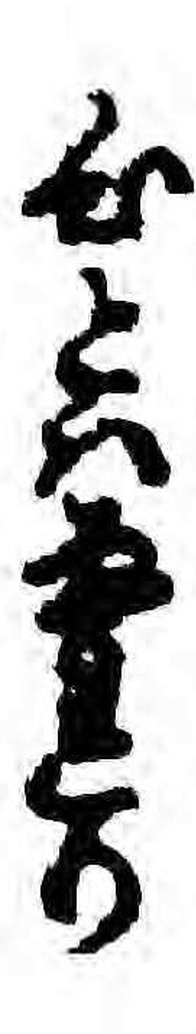心とはなれり
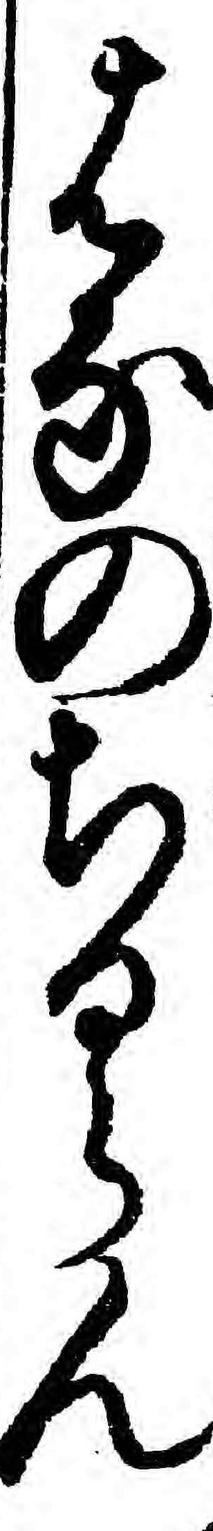はなのちるらん

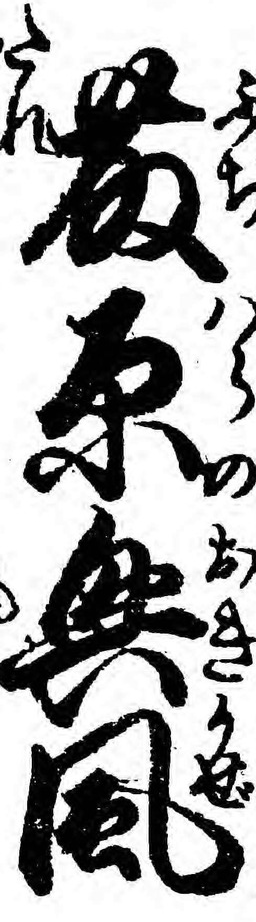藤原興風
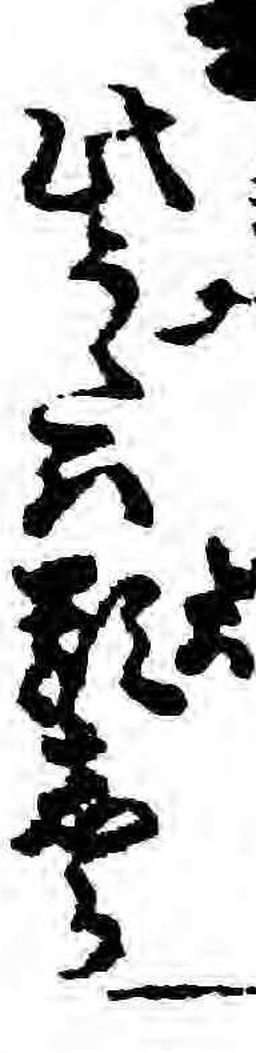此うたは題しら
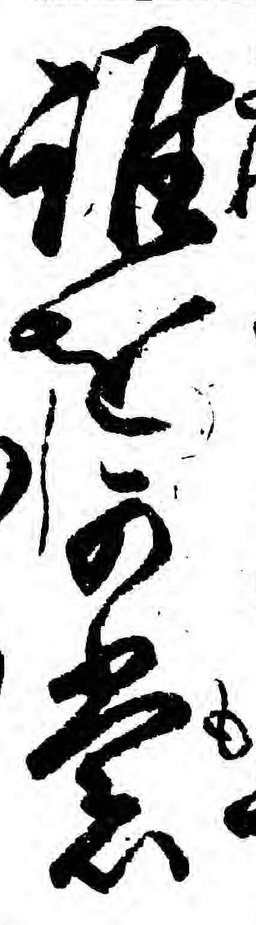誰をか裳
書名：頭書和歌注譯／壽賀多百人一首小倉錦
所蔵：国文学研究資料館
